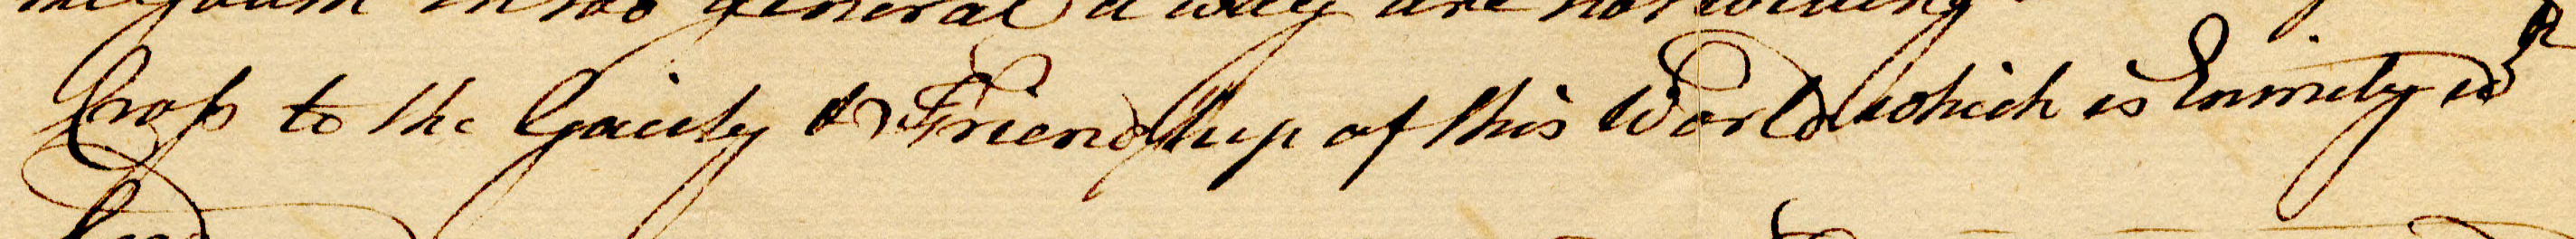Cross to the Gaiety & Friendship of this World which is Enmity w^th
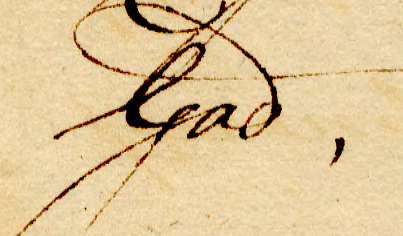God,
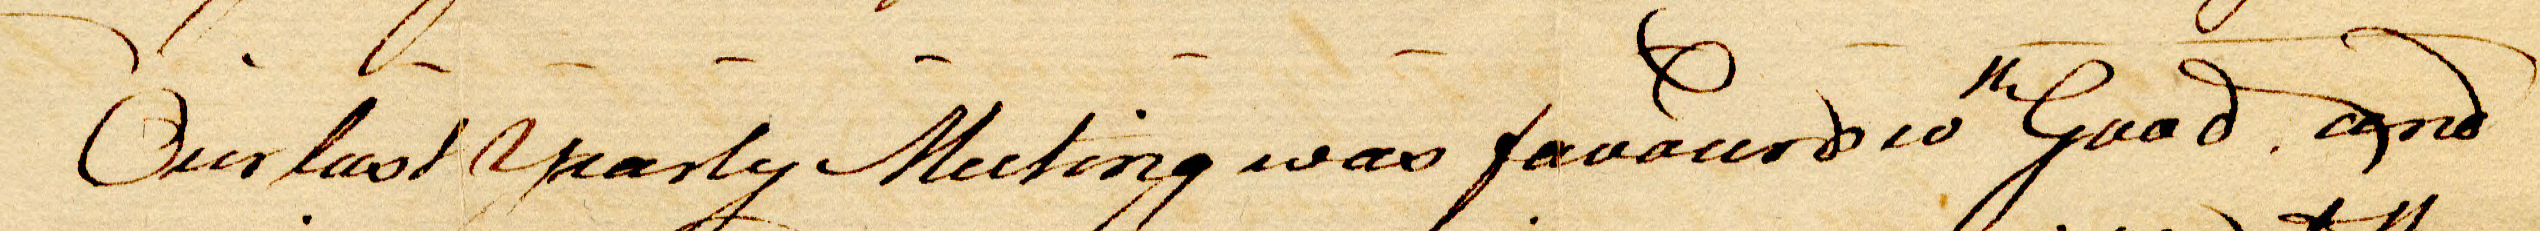Our last yearly Meeting was favourd w^th Good and
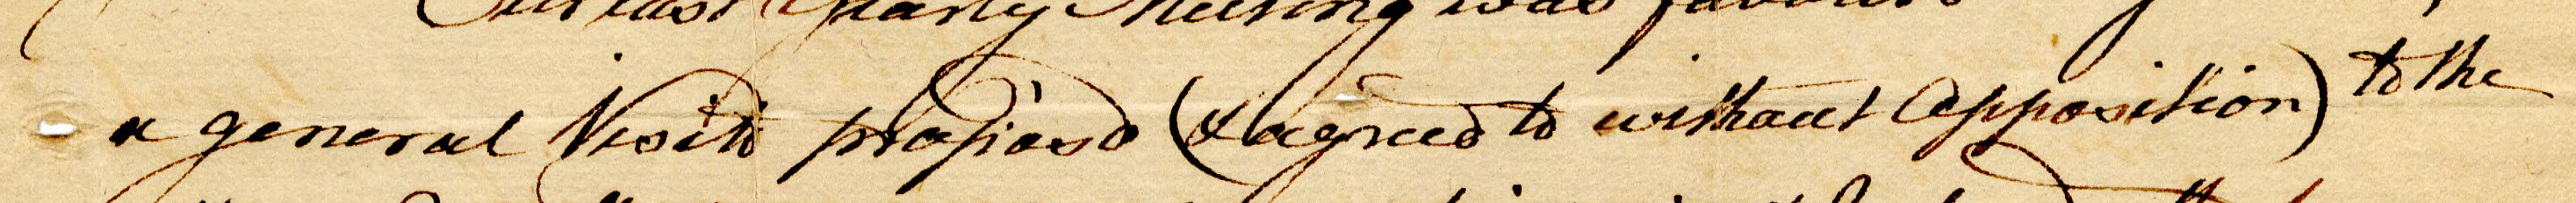a general Visit propos'd (& agreed to without Opposition) to the
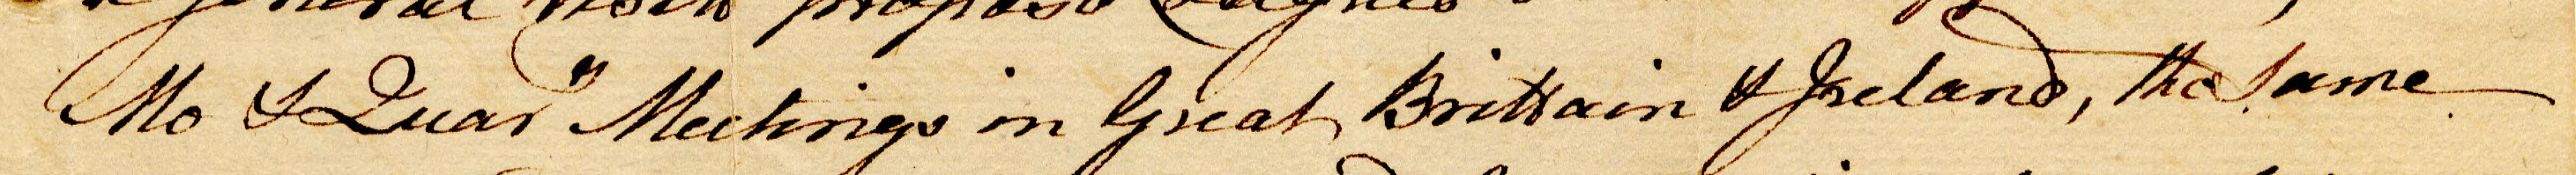Mo & Quar^y Meetings in Great Brittain & Ireland, the same
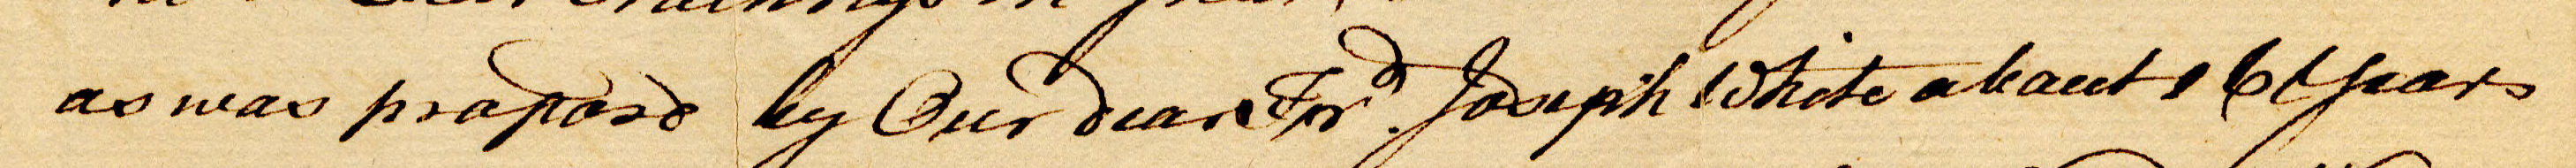as was proposed by Our dear Fr^d. Joseph White about 6 years
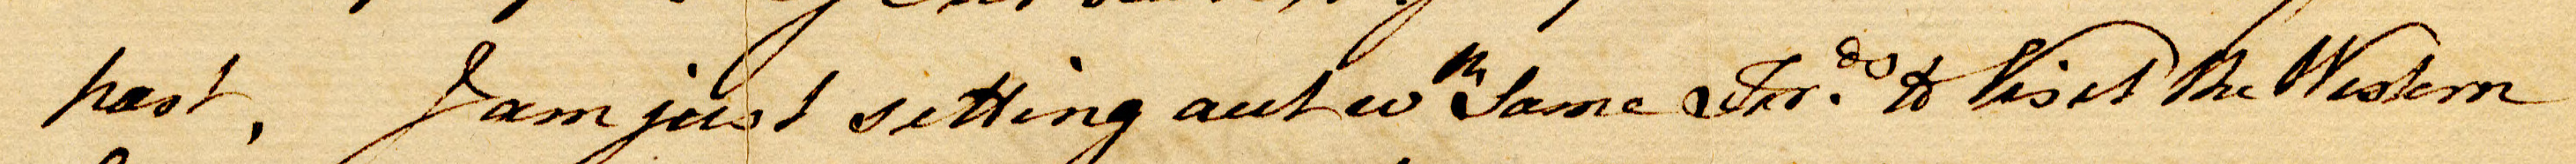past, I am just setting out w^th some Fr^ds. to Visit the Western
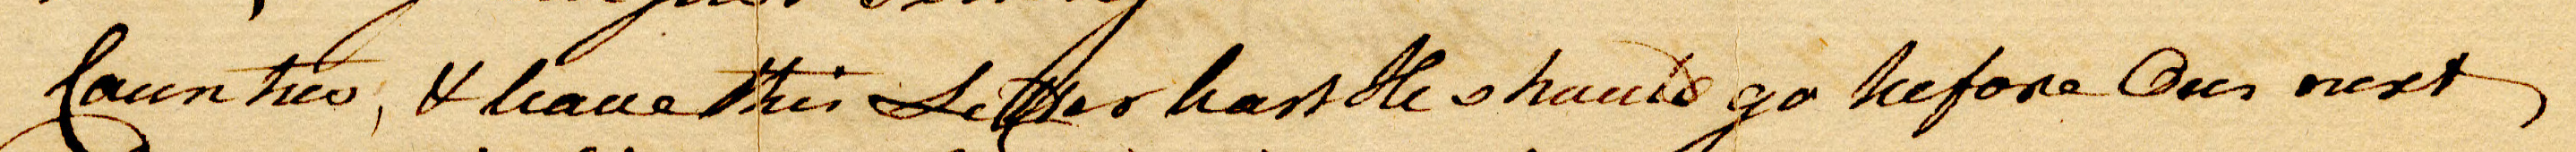Countries, & leave this Letter least he should go before Our next
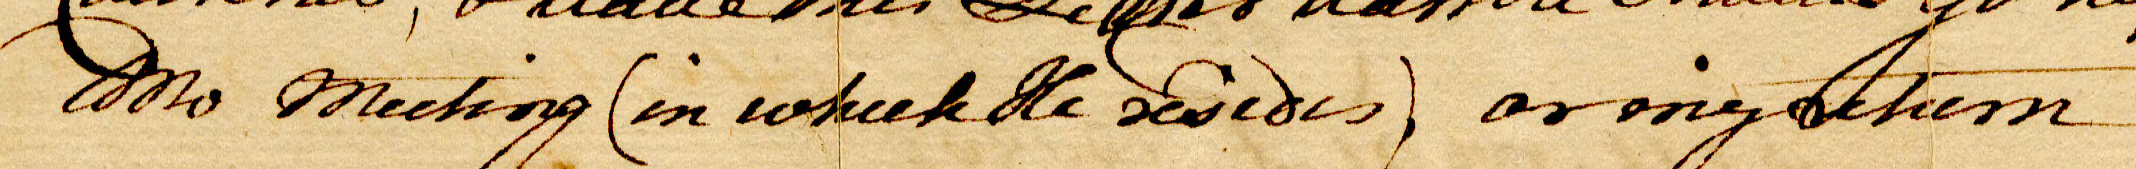Mo Meeting (in which He resides) or my return
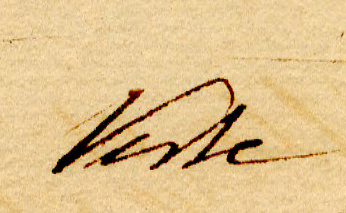Verte
